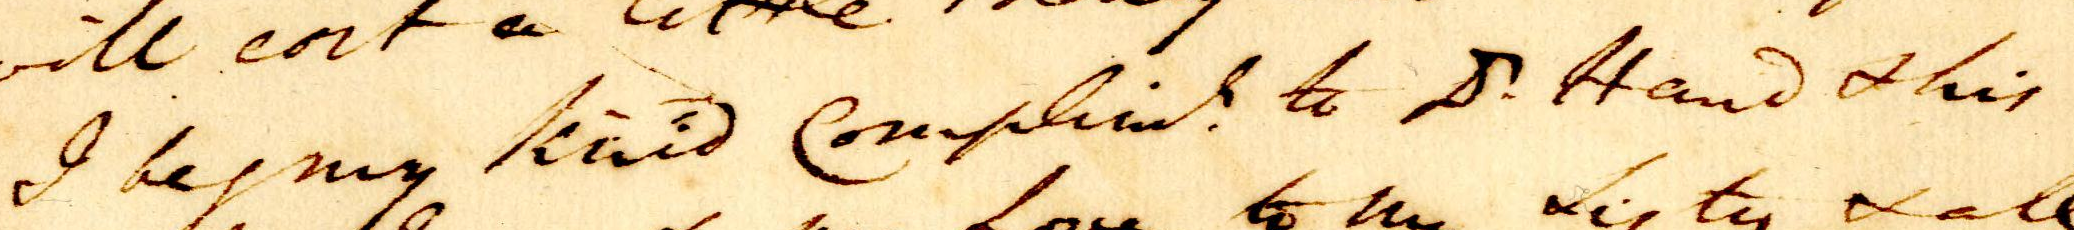I beg my kind Complim^t. to Dr. Hand & his
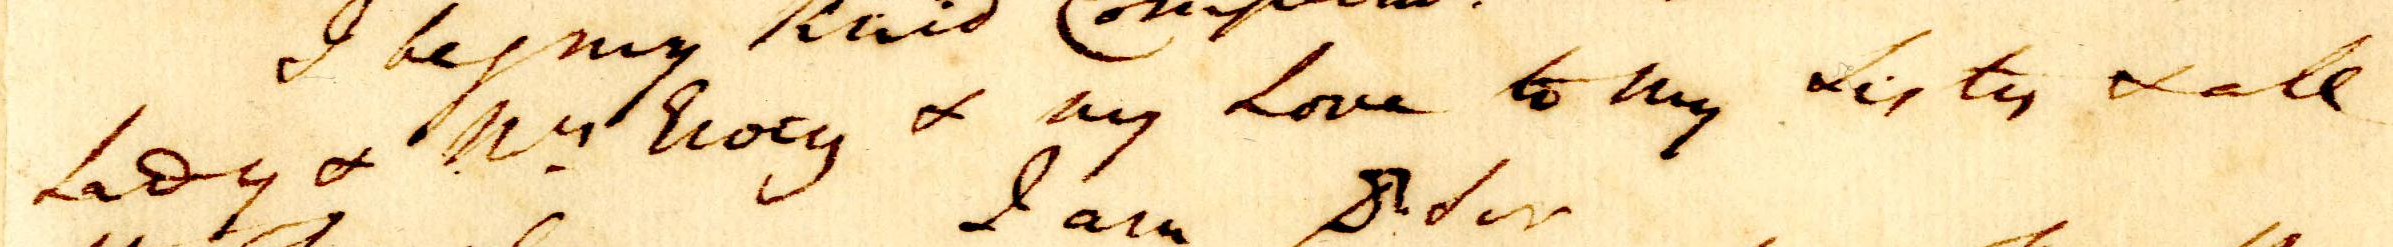Lady & M^rs ewing & my Love to my Sister & all
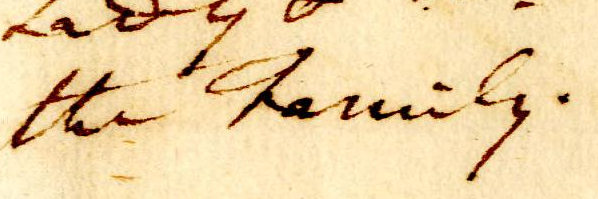the Family.
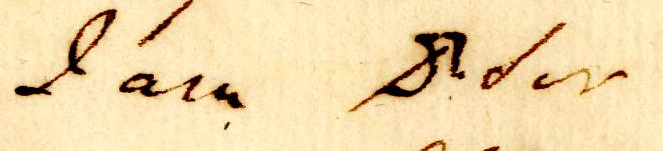I am D^r Sir
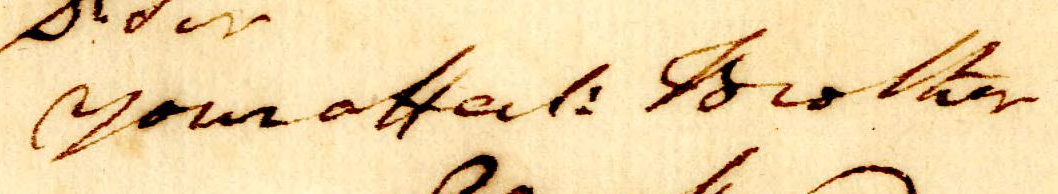Your affect: Brother
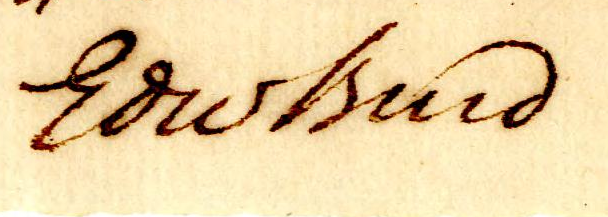EdwBurd
